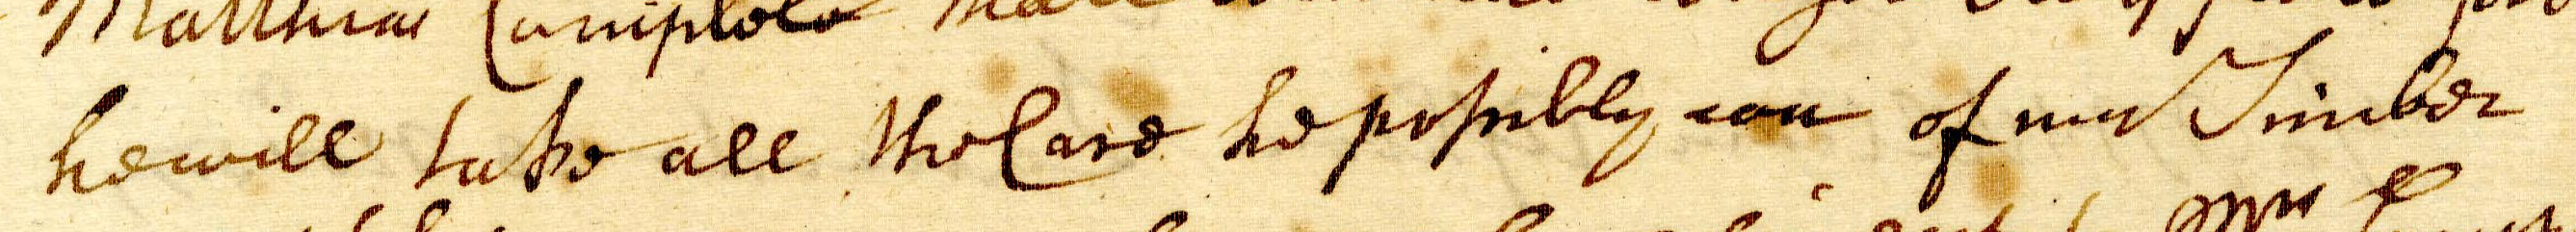he will take all the Care he possibly can of my Timber
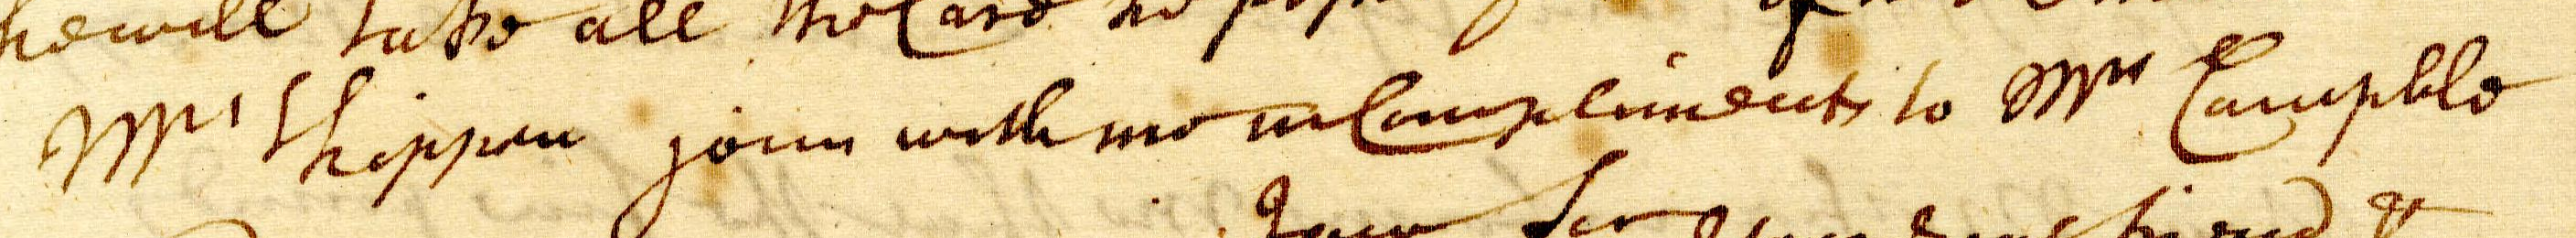M^rs Shippen joins with me in Compliments to M^rs Campbell
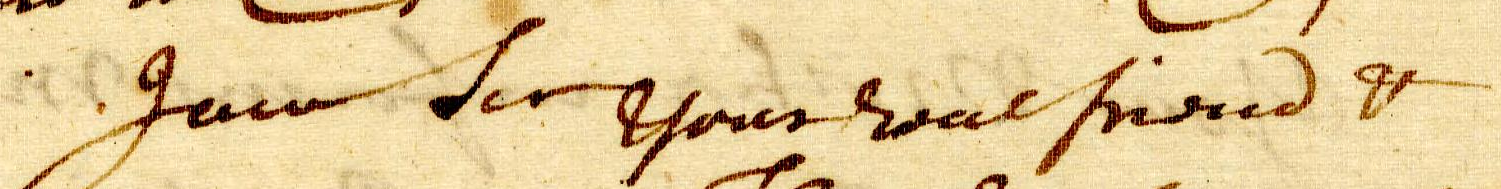I am Sir Your real friend &
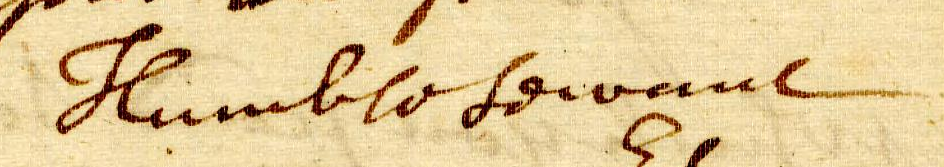Humble Servant
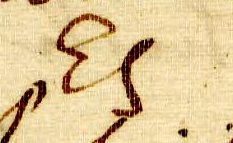ES
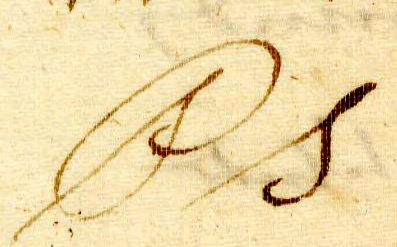PS
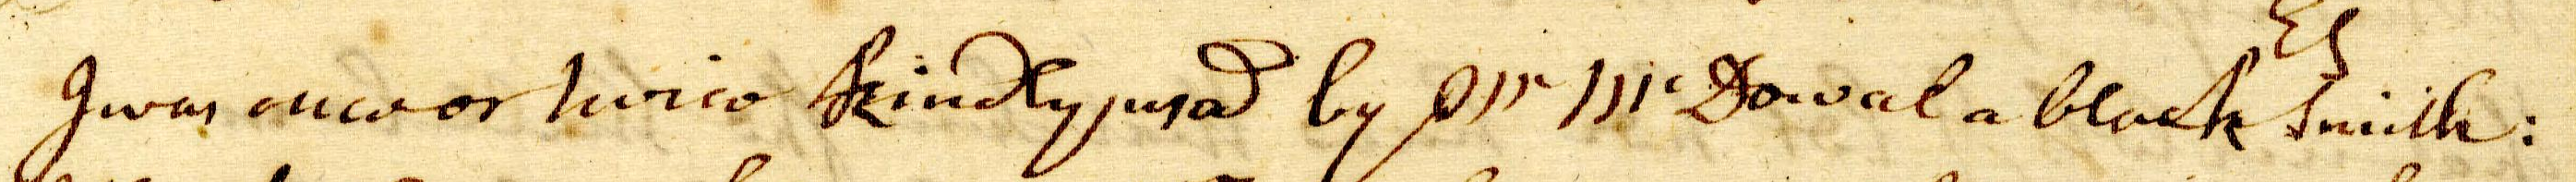I was once or twice kindly used by M^r M^r Dewal a black Smith:
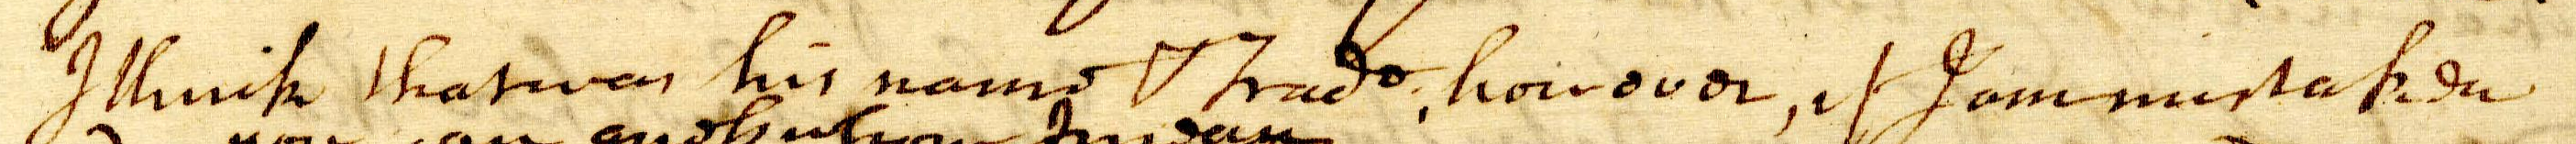I think that was his name & Trade; however, if I am mistaken
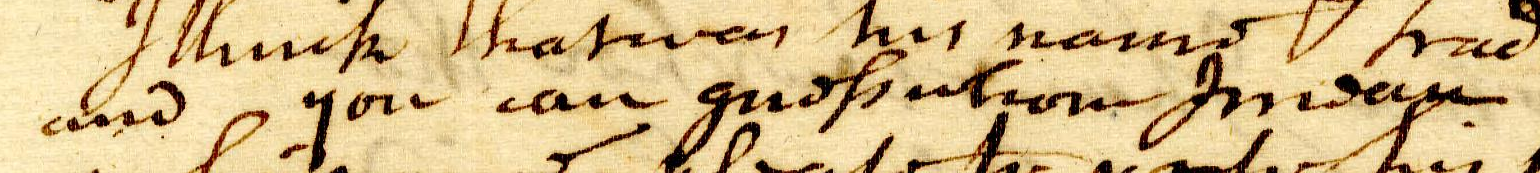and you can guess whom I mean
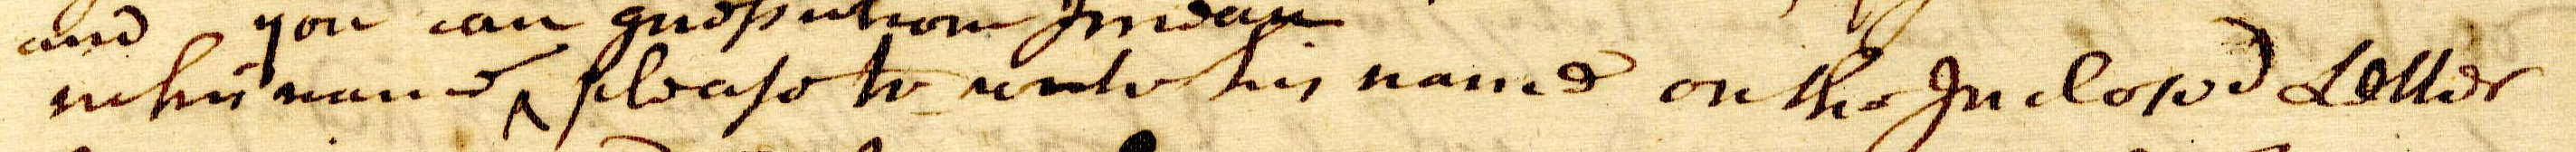or his name^ please to write his name on the Inclosed Letter
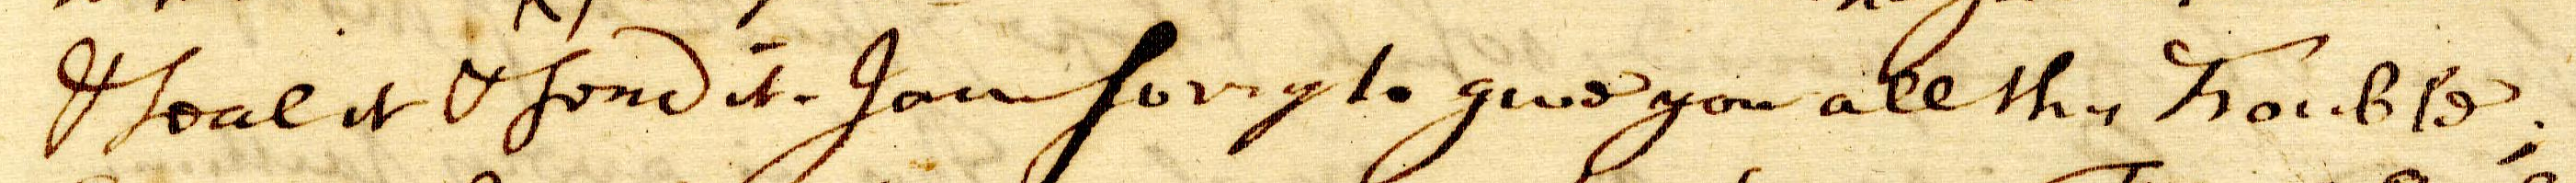& seal it & send it. I am sorry to give you all this Trouble
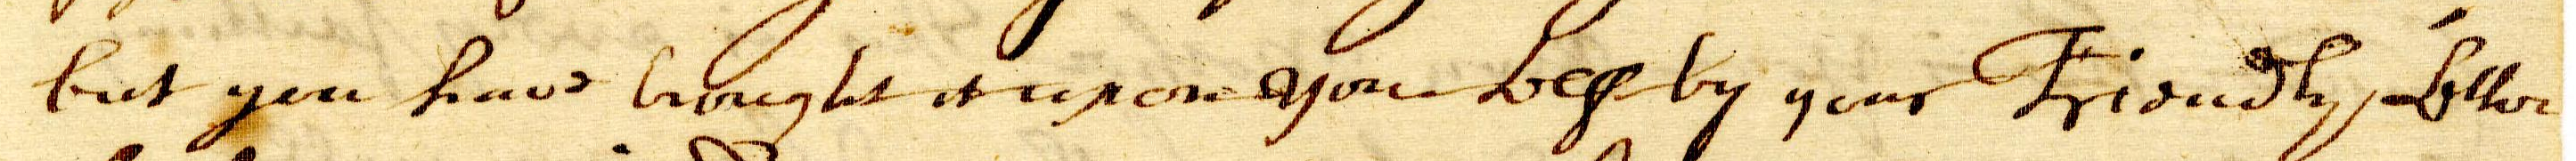but you have brought it upon you self by your Friendly Letter
